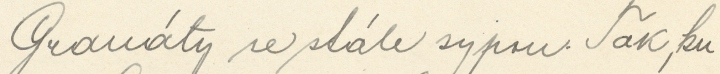Granáty se stále sypou. Tak, ku
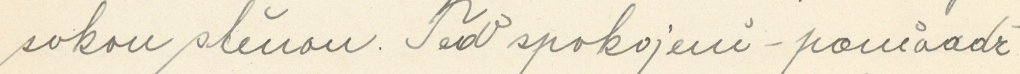sokou stěnou. Teď spokojeně - poněvadž
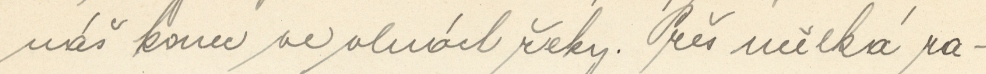náš konec ve vlnách řeky. Přes mělká ra-
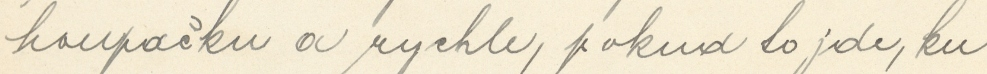houpačku a rychle, pokud to jde, ku
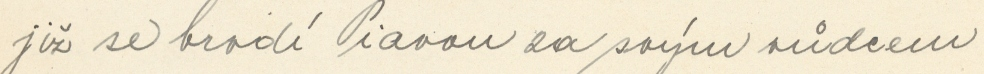již se brodí Piavou za svým vůdcem
